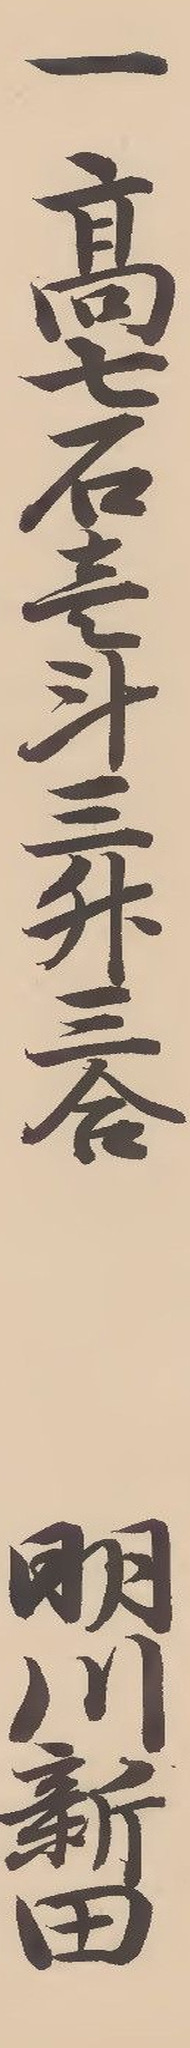一高七石壱斗三升三合明川新田
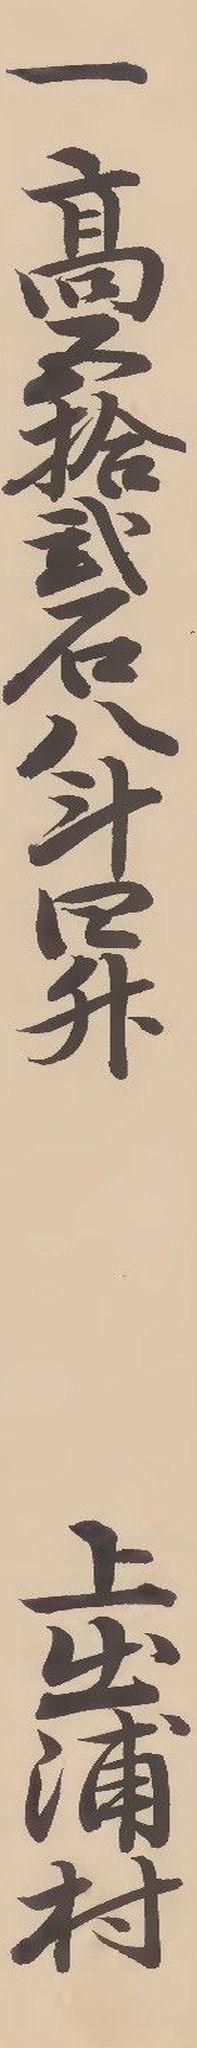一高五拾弐石八斗四升上出浦村
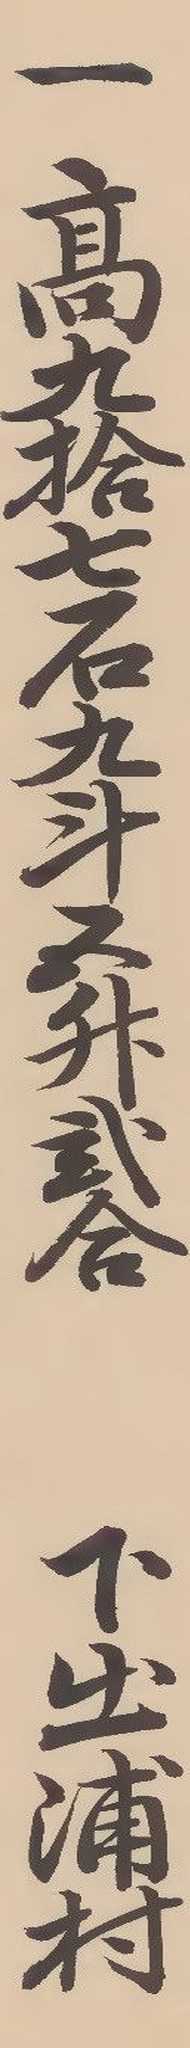一高九拾七石九斗五升弐合下出浦村
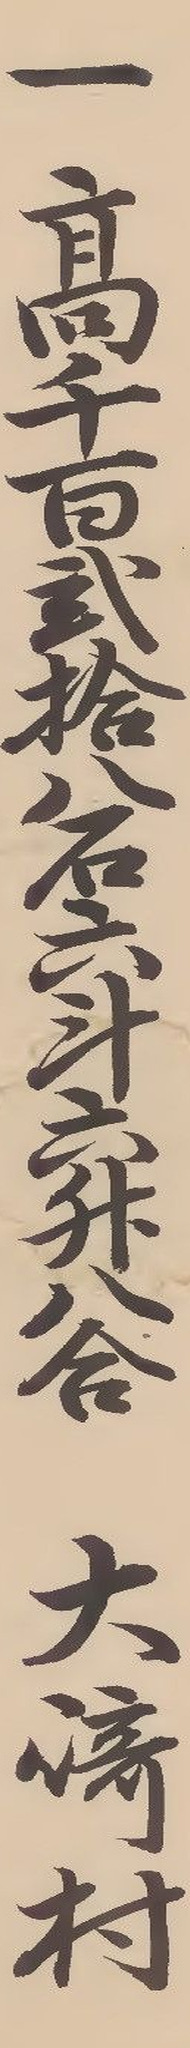一高千百弐拾八石六斗六升八合大崎村
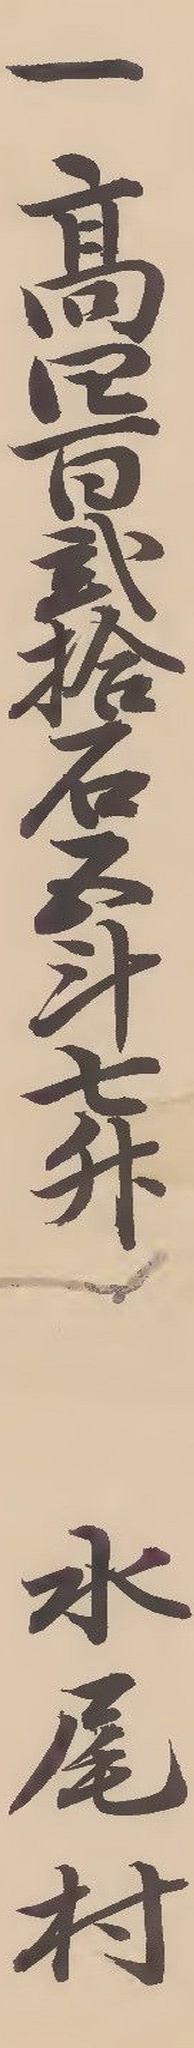一高四百弐拾石五斗七升水尾村

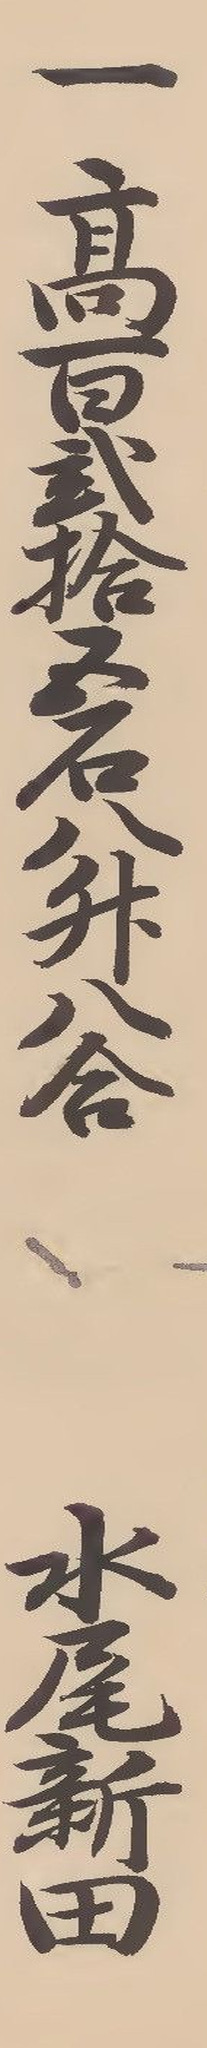一高百弐拾五石八升八合水尾新田
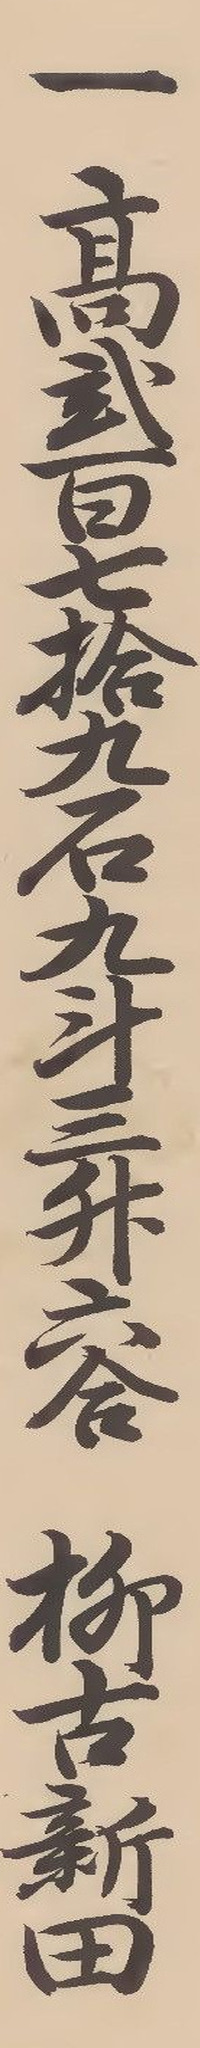一高弐百七拾九石九斗三升六合柳古新田
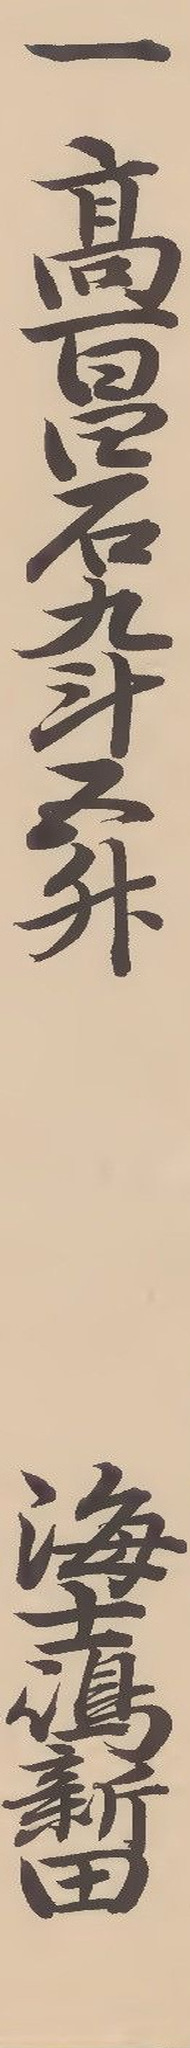一高百四石九斗五升海士島新田
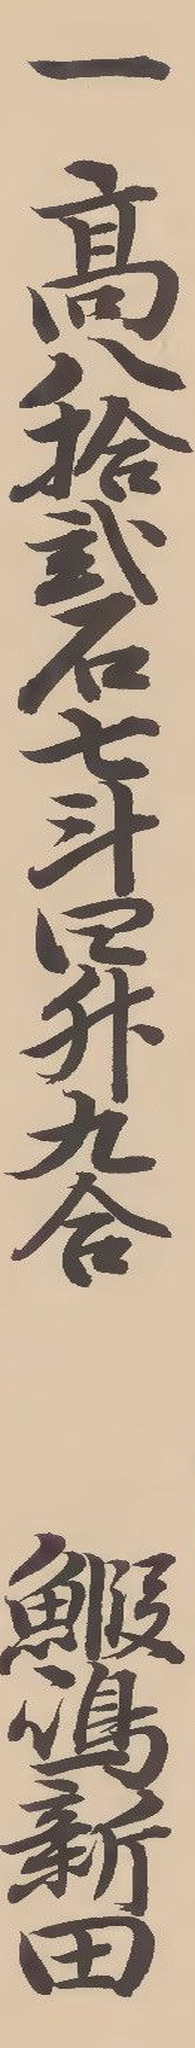一高八拾弐石七斗四升九合鰕島新田
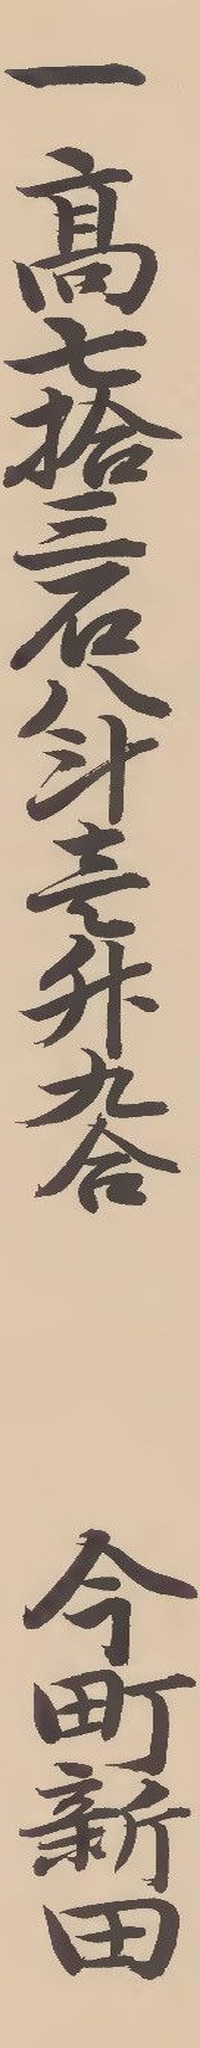一高七拾三石八斗壱升九合今町新田
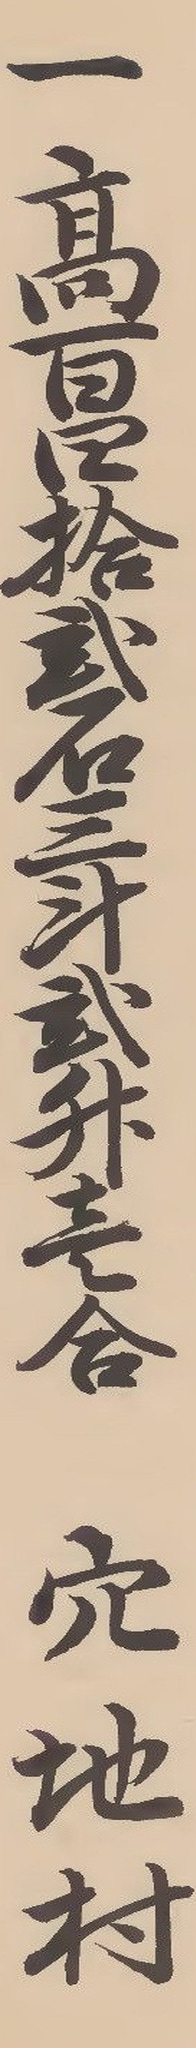一高百四拾弐石三斗弐升壱合穴地村
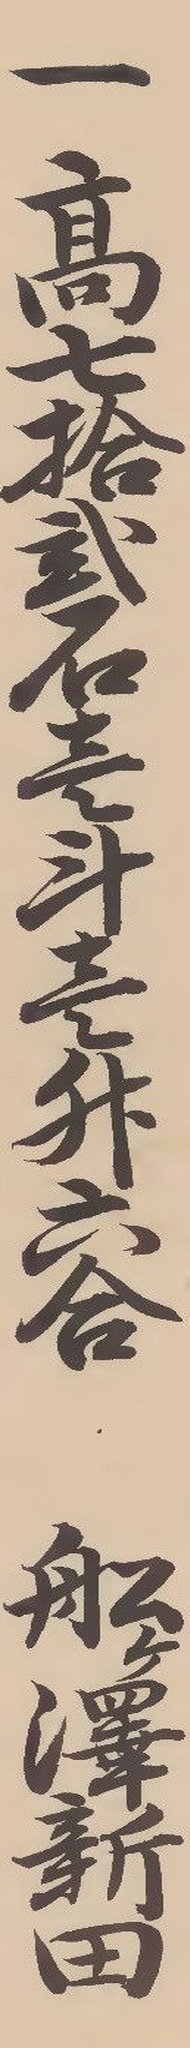一高七拾弐石壱斗壱升六合船ヶ沢新田
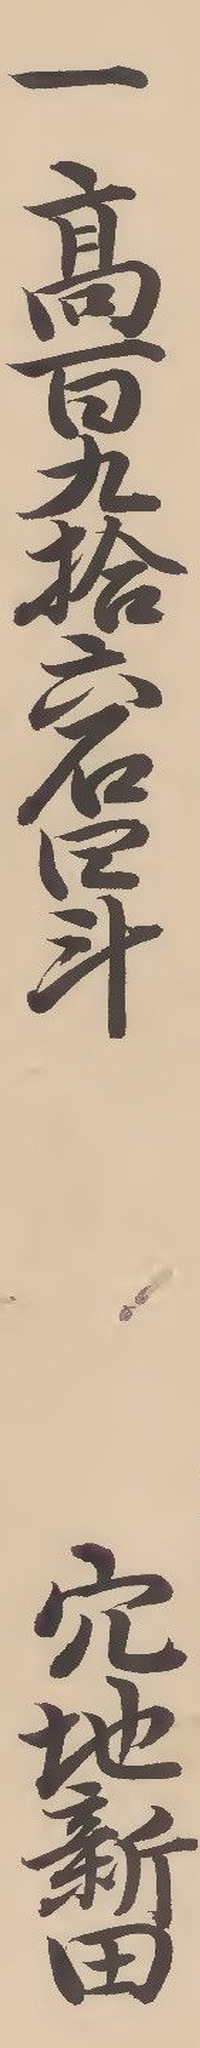一高百九拾六石四斗穴地新田

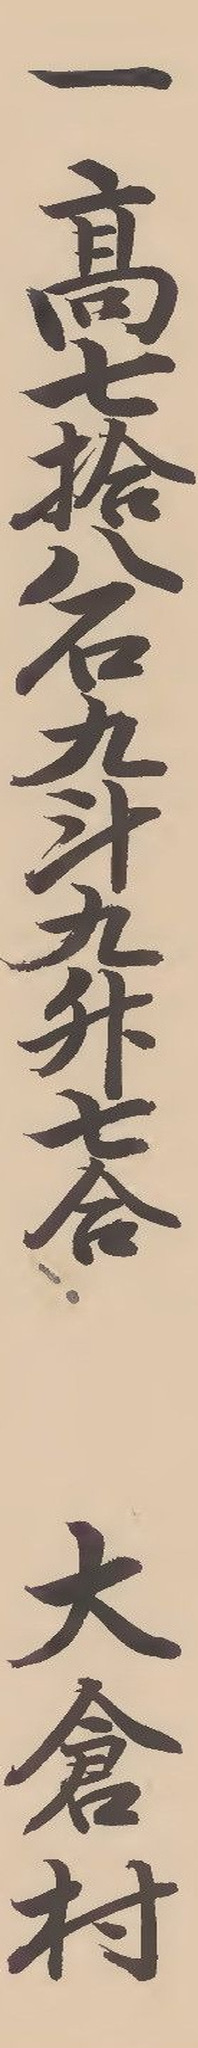一高七拾八石九斗九升七合大倉村
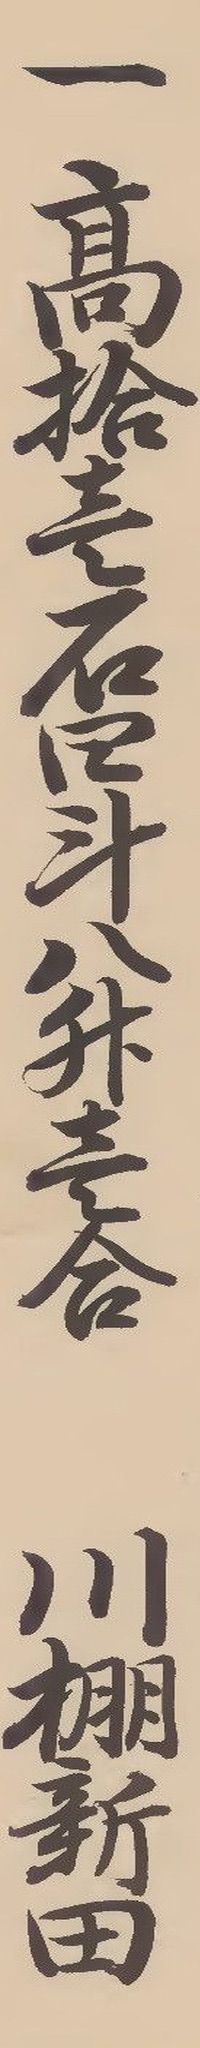一高拾壱石四斗八升壱合川棚新田
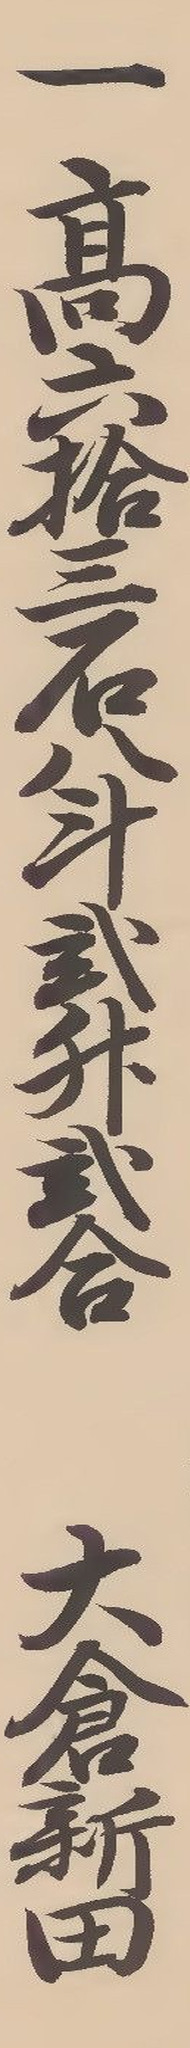一高六拾三石八斗弐升弐合大倉新田
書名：越後国郷帳　中
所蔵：国立公文書館 National Archives of Japan
